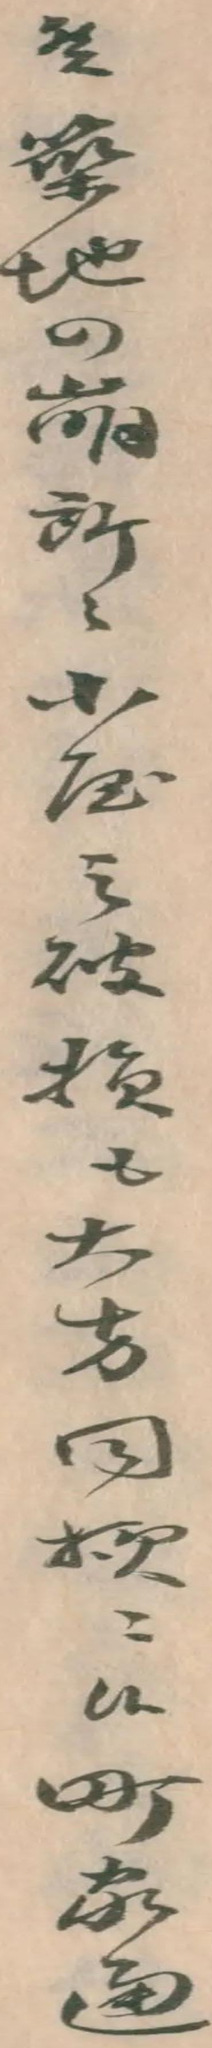候築地の崩所々小屋之破損も大方同様二候町家通
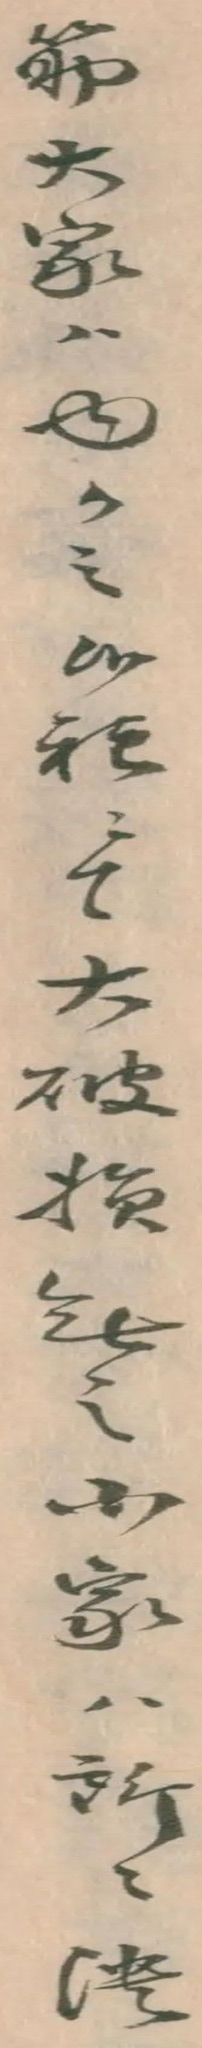筋大家ハゆかミ候程二て大破損無之小家ハ所々潰
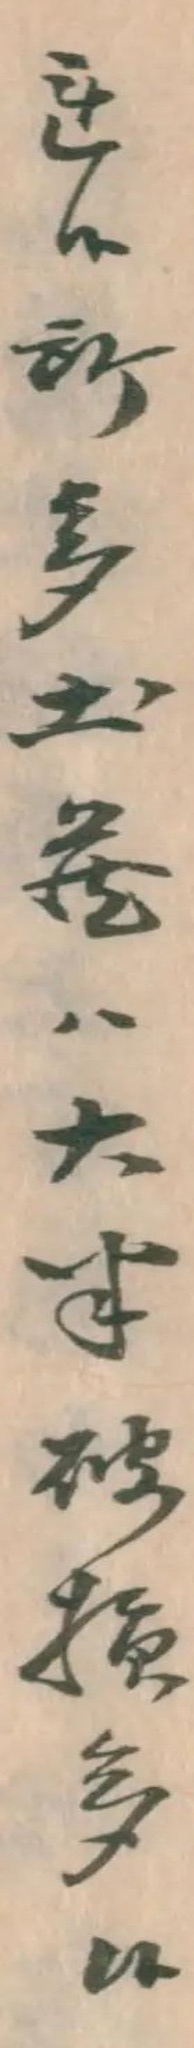れ候所多土蔵ハ大半破損多候
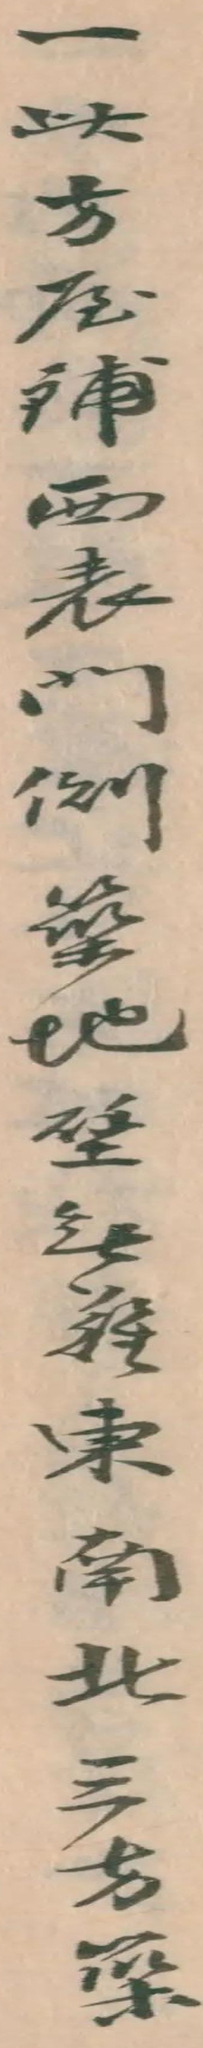一此方屋鋪西表門側築地壁無難東南北三方築
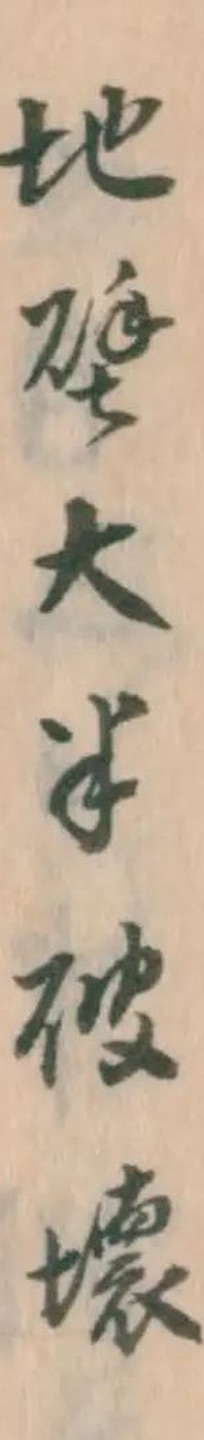地壁大半破壊
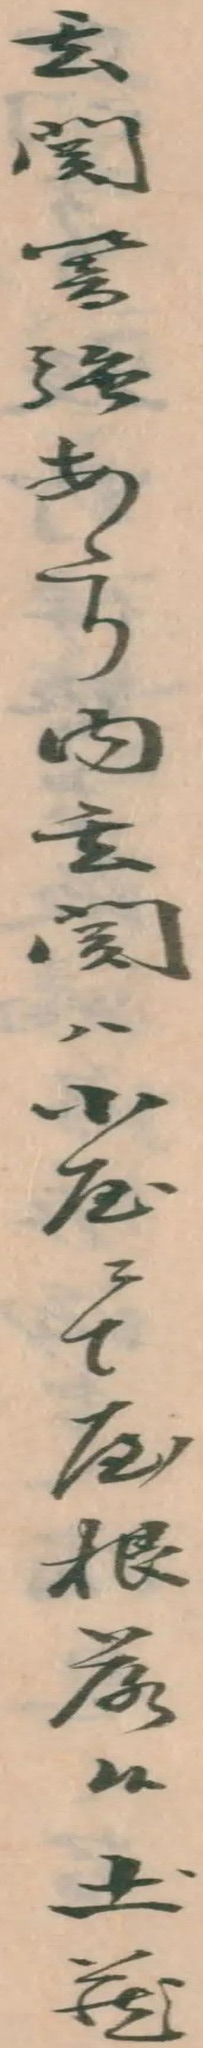玄関響強あたり内玄関ハ小屋二て屋根落候土蔵
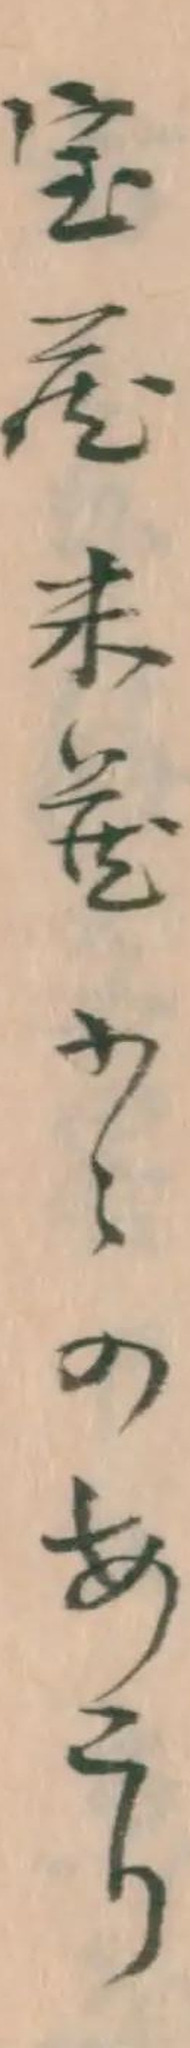宝屋未蔵少々のあたり
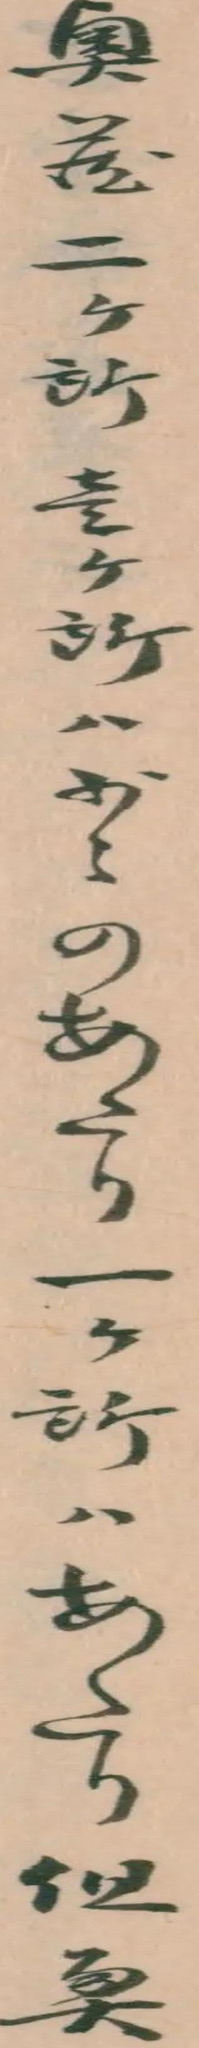奥蔵二ヶ所壱ヶ所ハ少々のあたり一ヶ所ハあたり但奥
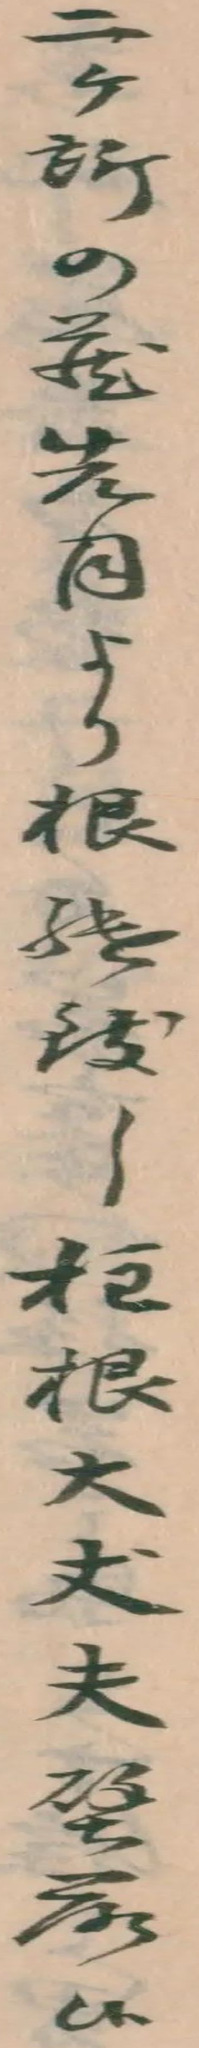二ヶ所の蔵先月より根張致し垣根大丈夫壁落候
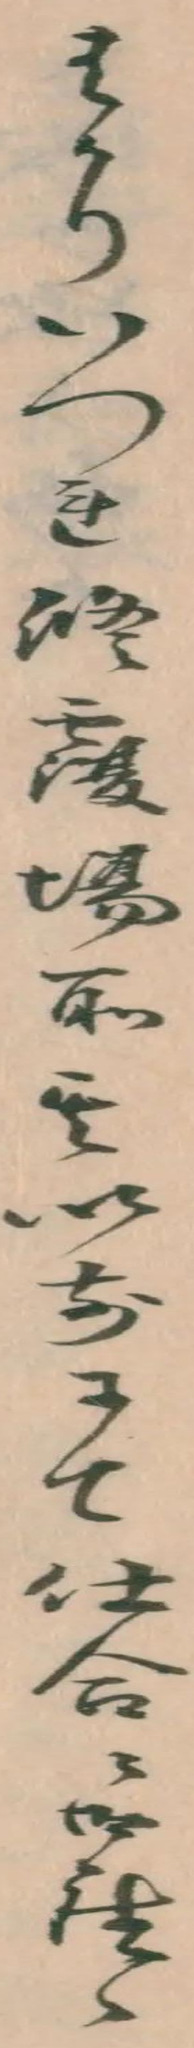はかりいつれ修覆場所其以前にて仕合二御座候
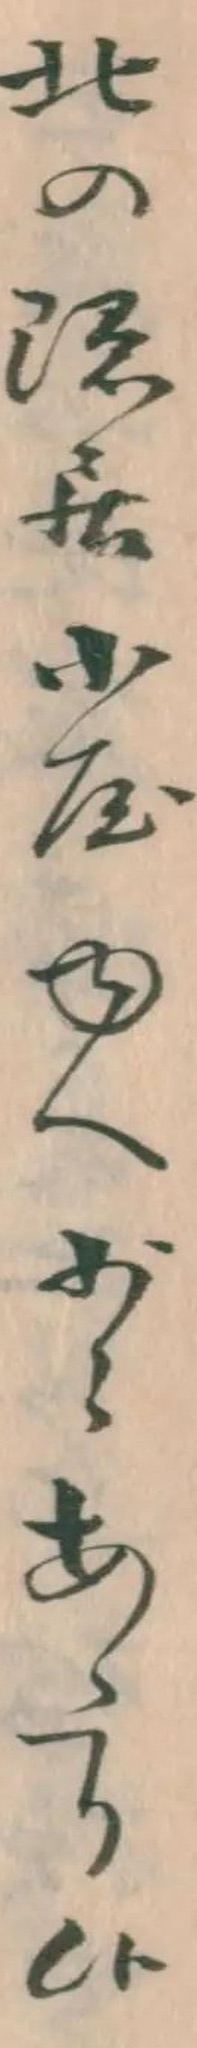北の隠居小屋ゆへ少々あたり候
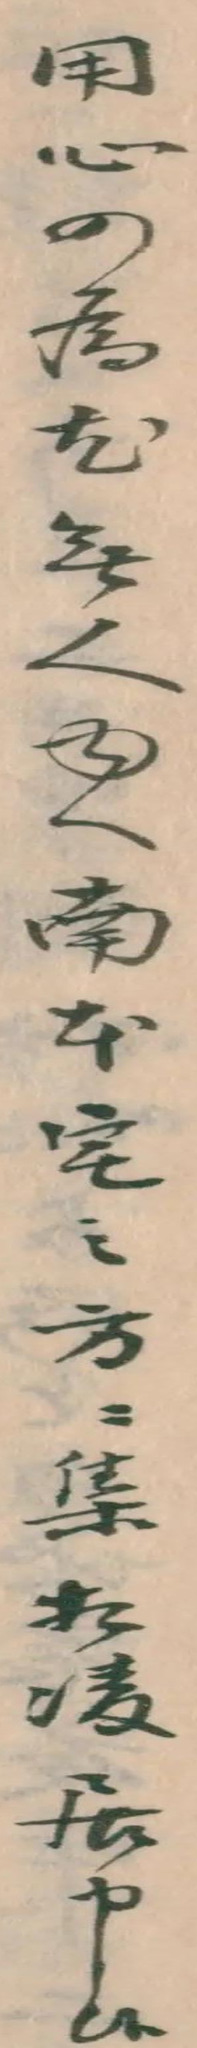用心の為尤無人ゆへ南本宅之方二集相凌申候
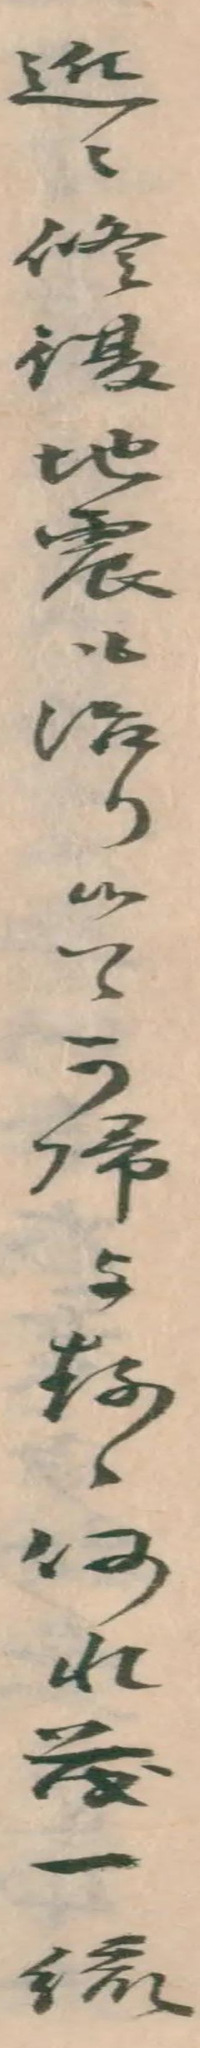近々修覆地震も治り候ハゝ可帰と存候何れも一統
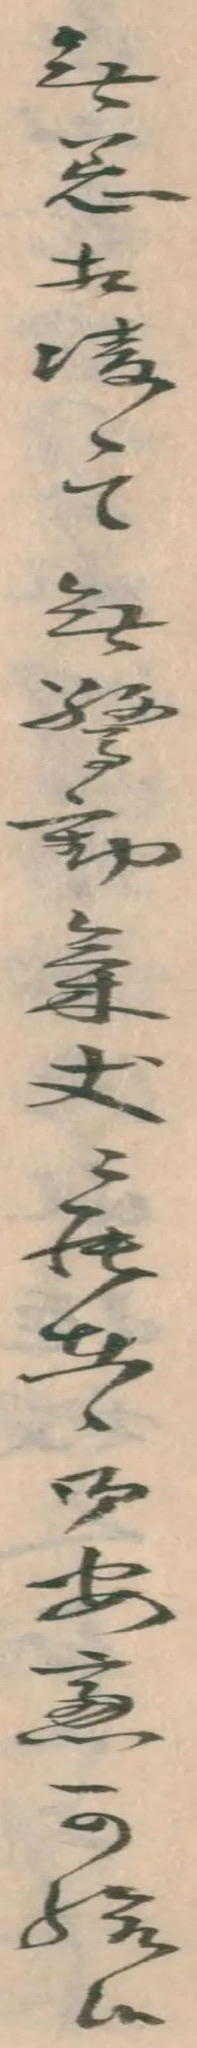無恙相凌候て無驚動気丈二罷在候御安慮可給候
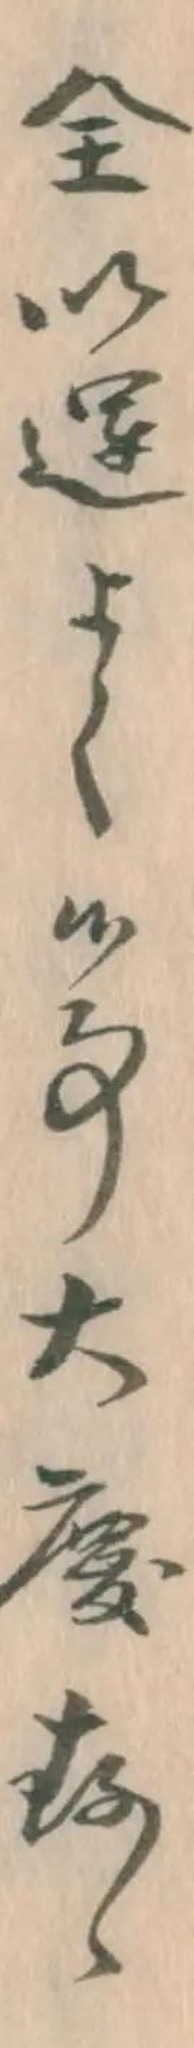全以運よく候事大慶存候
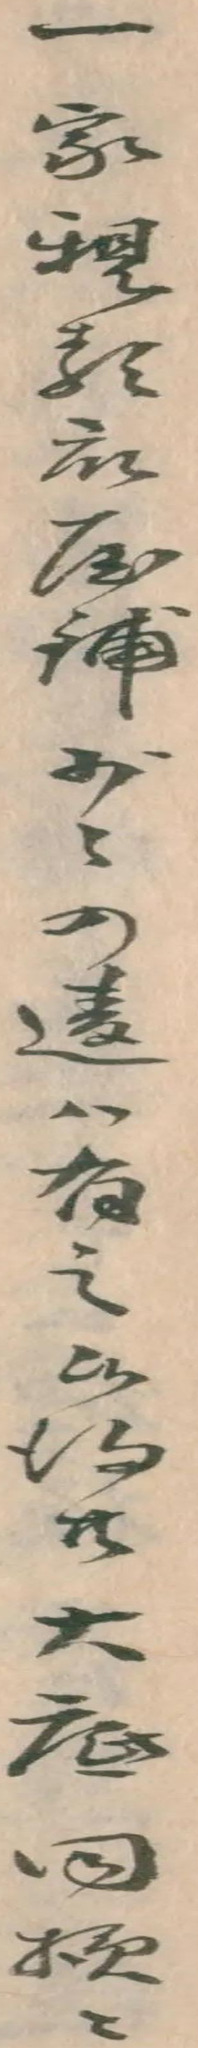一家親類衆屋鋪少々の違ハ有之候得共大底同様二
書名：京都地震
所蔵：国立国会図書館 National Diet Library, JAPAN
